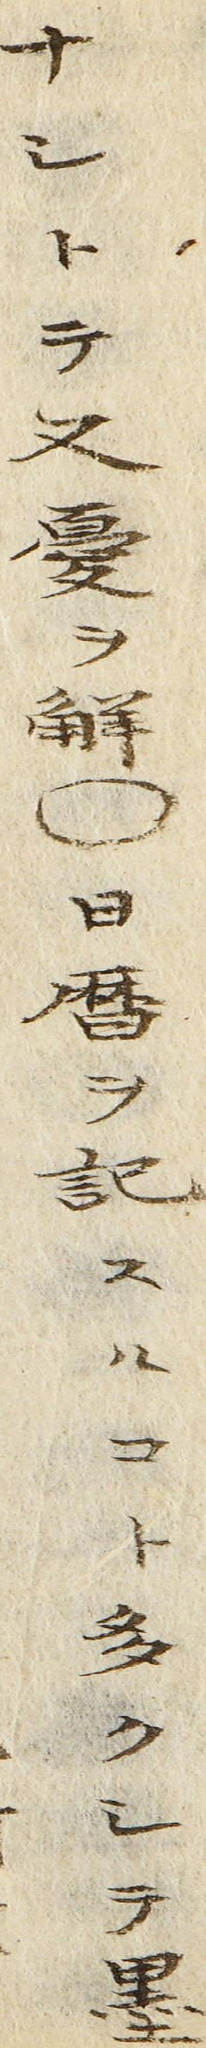ナシトテ又憂ヲ解◯日暦ヲ記スルコト多クシテ墨
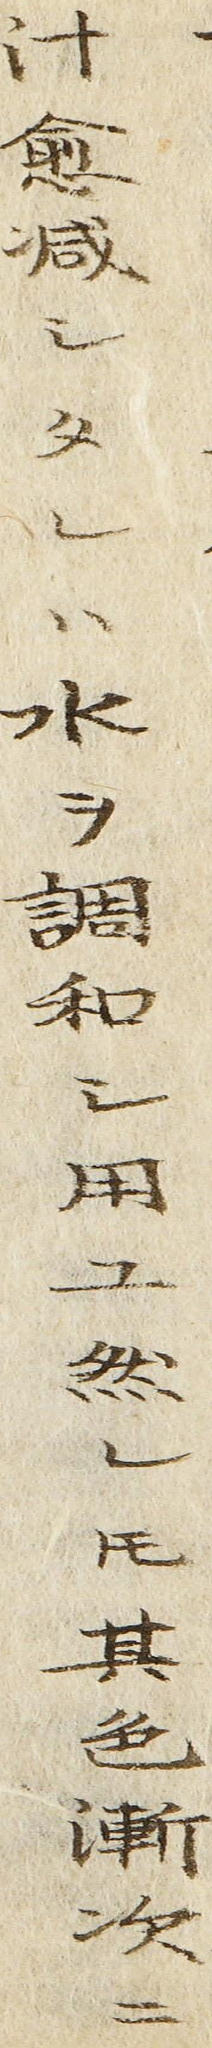汁愈減シタレハ水ヲ調和シ用ユ然レトモ其色漸次ニ
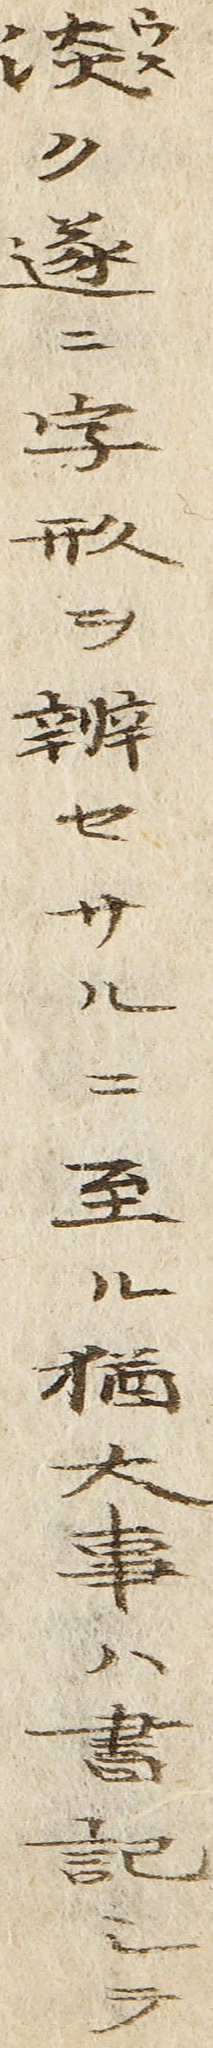淡ク遂ニ字形ヲ弁セサルニ至ル猶大事ハ書記シテ
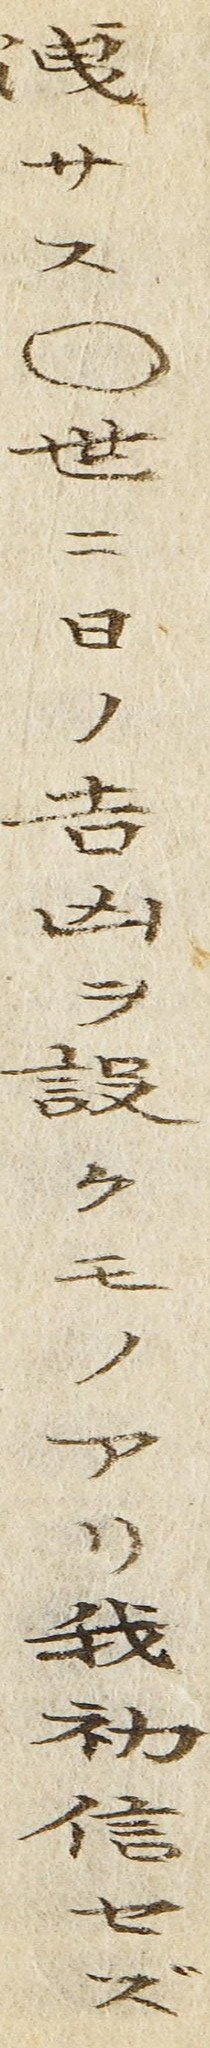洩サス◯世ニ日ノ吉凶ヲ設クモノアリ我初信セズ
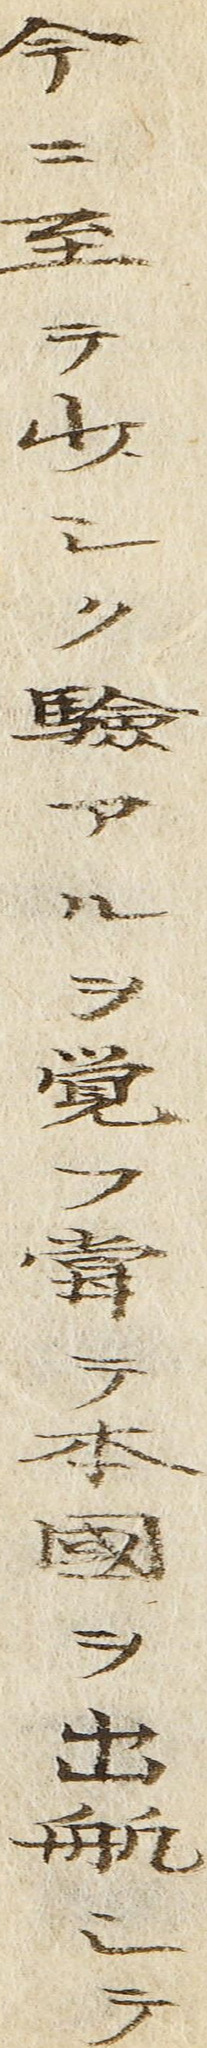今ニ至テ少シク験アルヲ覚フ嘗テ本国ヲ出航シテ
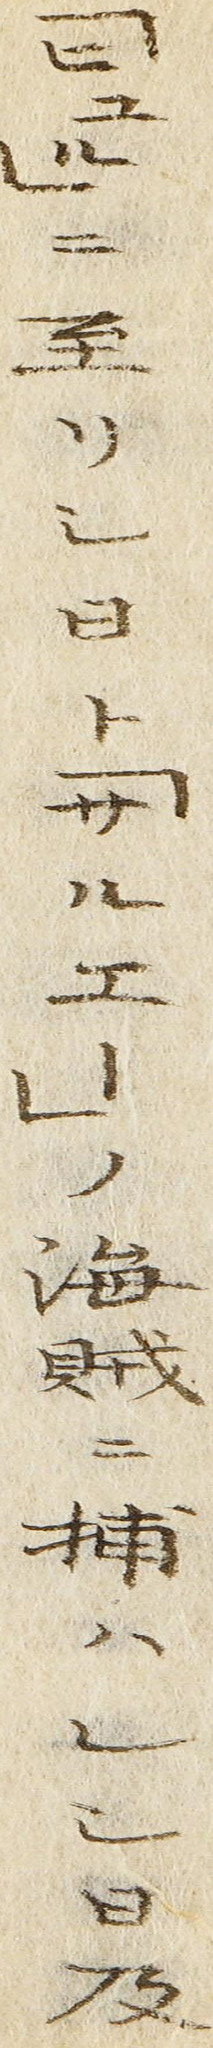「ヒユル」ニ至リシ日ト「サルエー」ノ海賊ニ捕ハレシ日及
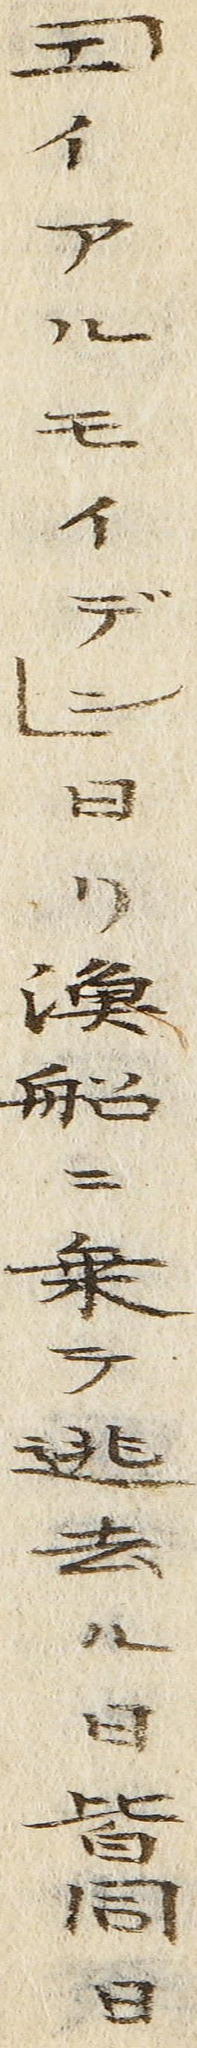「エイアルモイデン」日リ漁船ニ乗テ逃去ル日皆同日
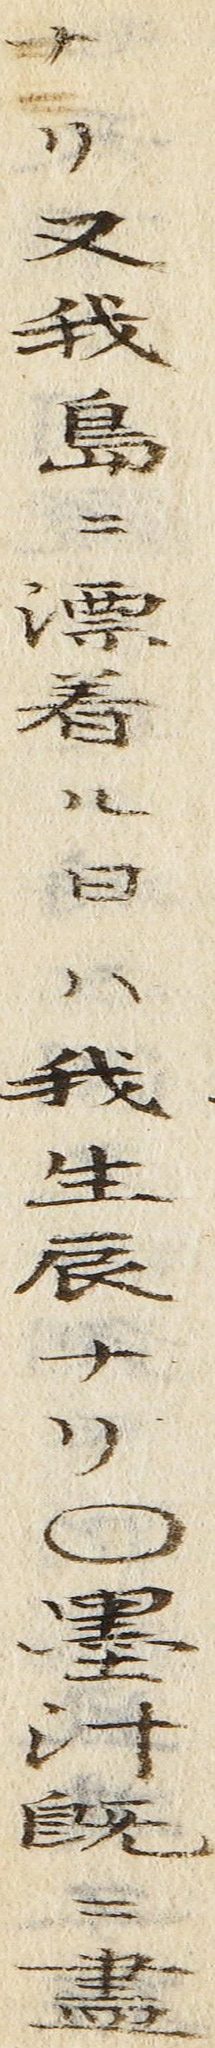ナリ又我島ニ漂着ル日ハ我生辰ナリ◯墨汁既ニ尽
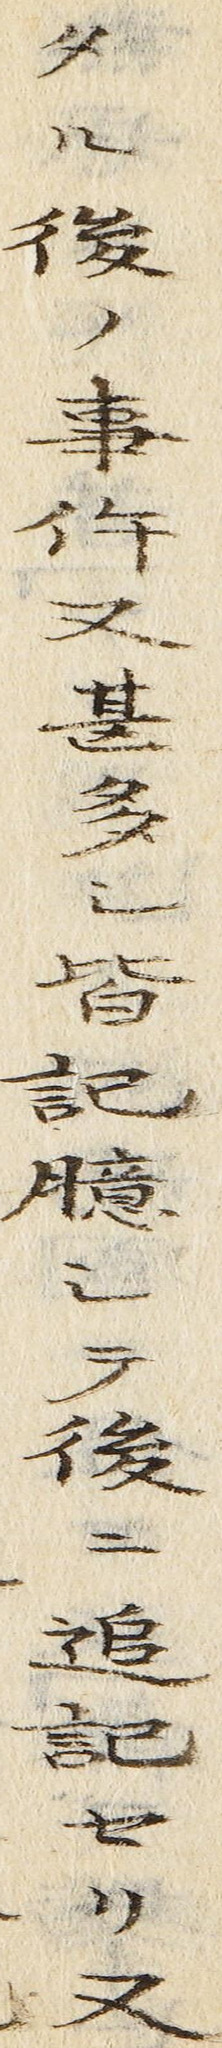タル後ノ事件又甚多シ皆記臆シテ後ニ追記セリ又
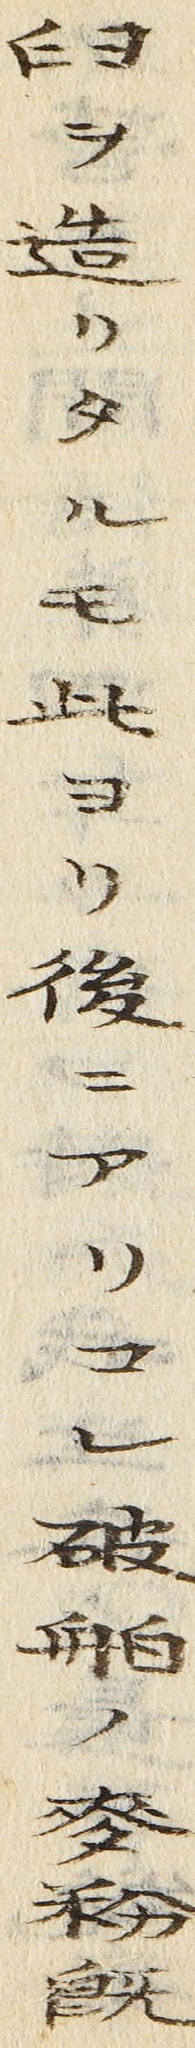臼ヲ造リタルモ此ヨリ後ニアリコレ破舶ノ麦粉既
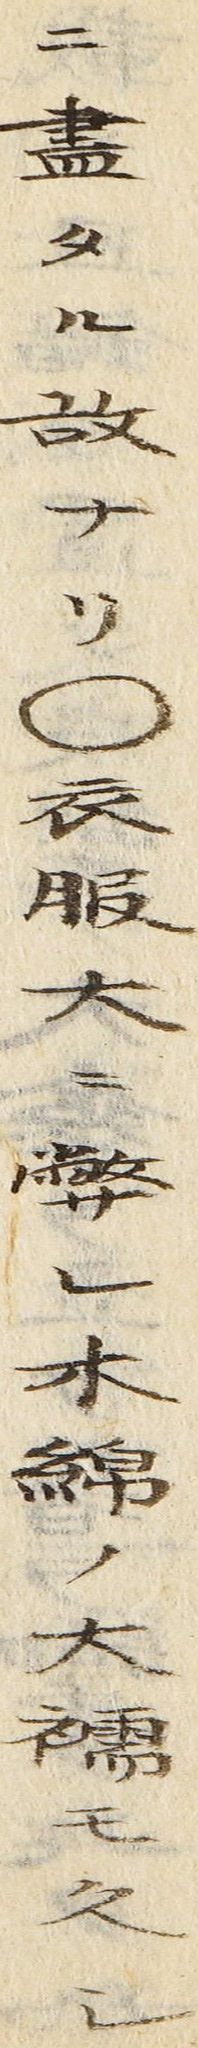ニ尽タル故ナリ◯衣服大ニ弊レ木綿ノ大襦モ久シ
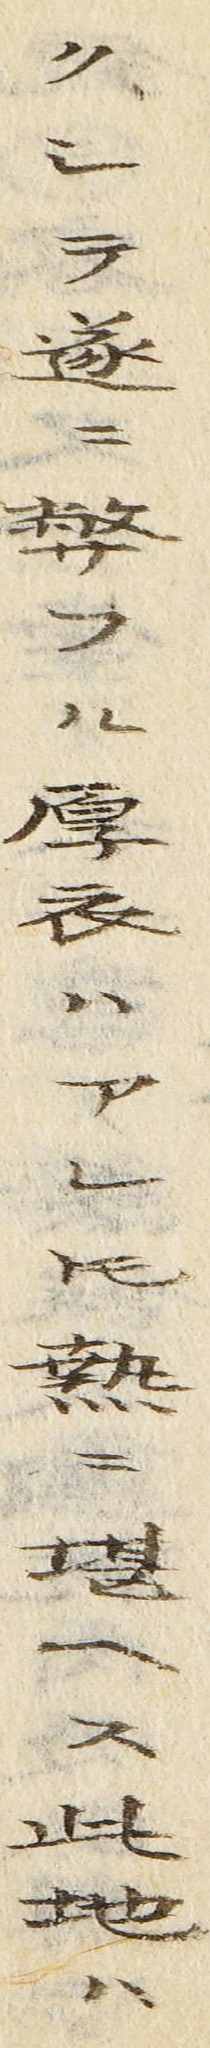クシテ遂ニ弊フル厚衣ハアレトモ熱ニ堪ヘス此地ハ
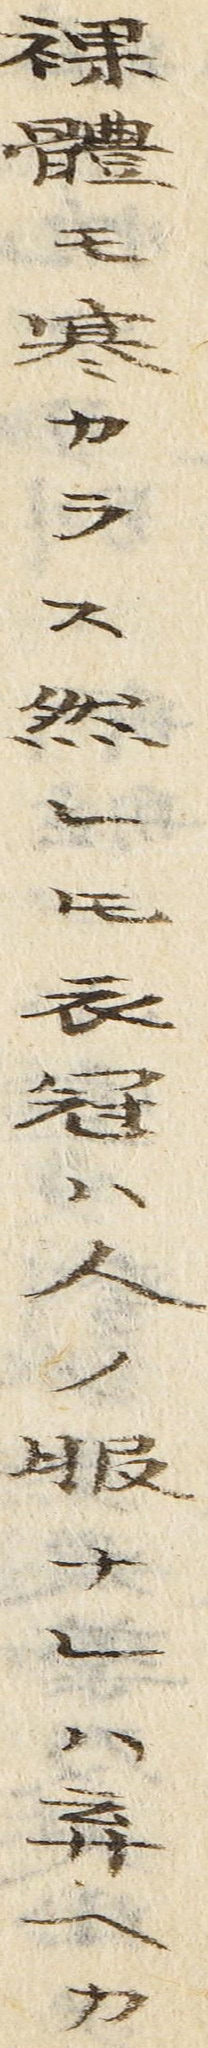裸体モ寒カラス然レトモ衣冠ハ人ノ服ナレハ棄ヘカ
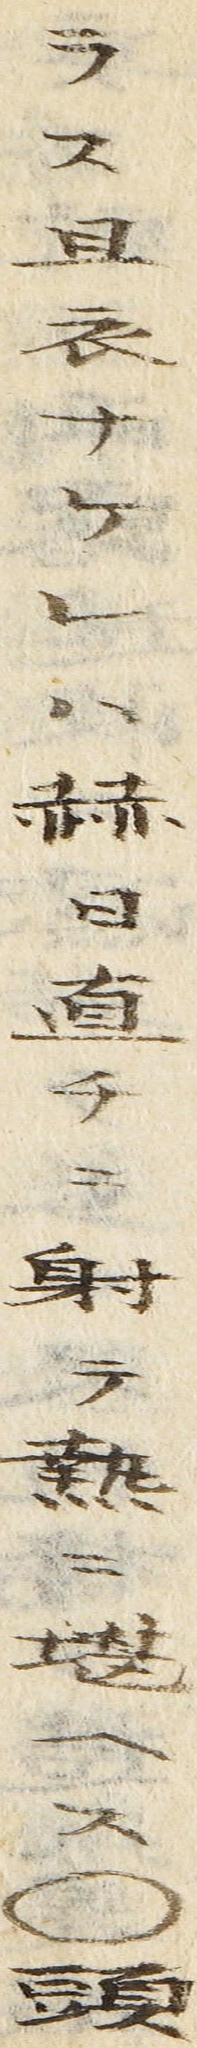ラス且衣ナケレハ赫日直チニ射テ熱ニ堪ヘス◯頭
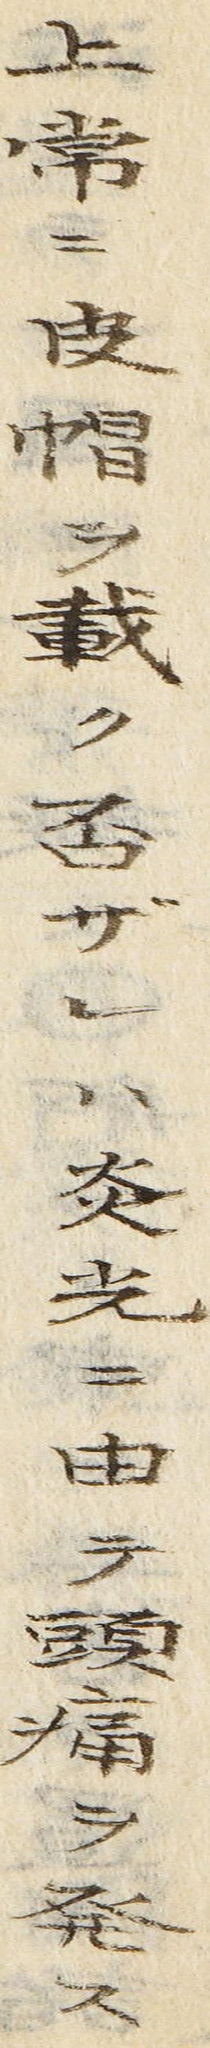上常ニ皮帽ヲ載ク否ザレハ炎光ニ由テ頭痛ヲ発ス
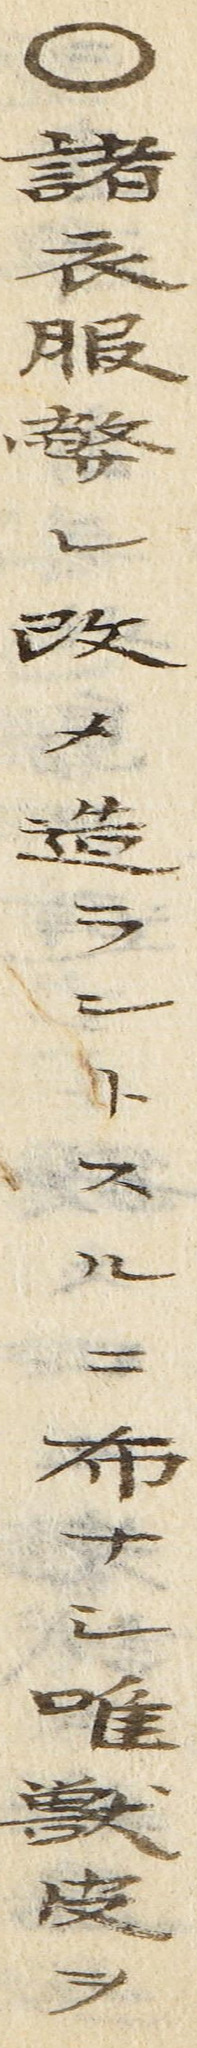◯諸衣服弊レ改メ造ラントスルニ布ナシ唯獣皮ヲ
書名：漂流紀事
